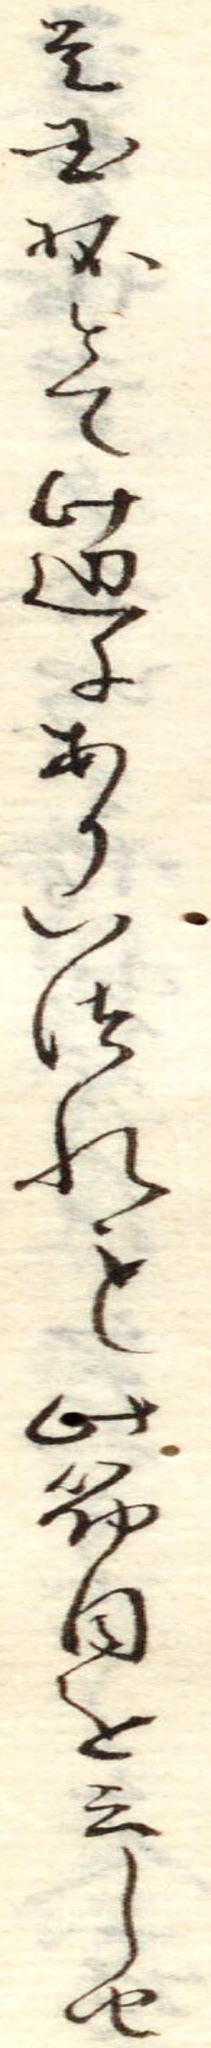是国抔とて此辺にありいつれも此筋目を云し由
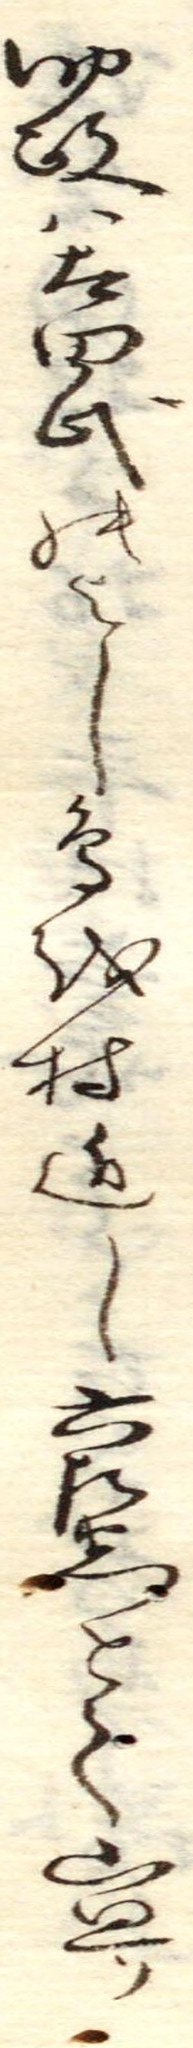助政は太田氏のよし鳥越村近し六左衛門とて山廻り

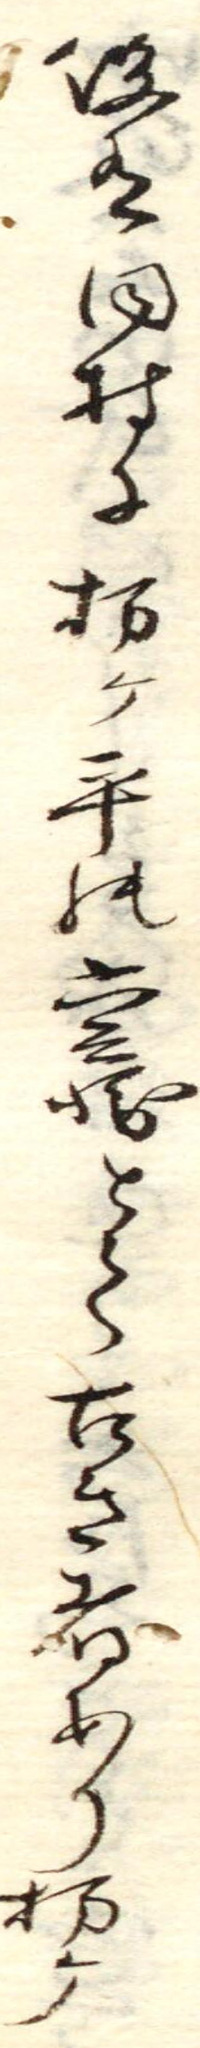役有同村に栃ヶ平の六兵衛とて古き者あり栃ヶ
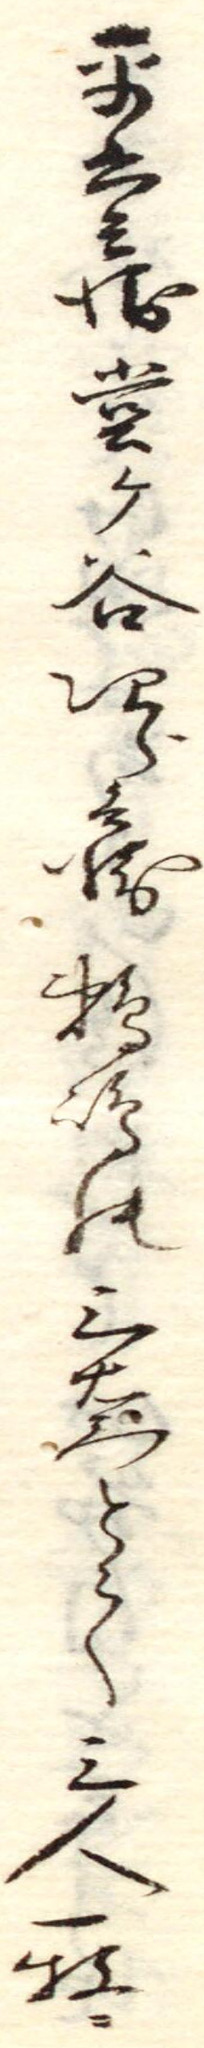平六兵衛堂ヶ谷次郎兵衛鵜島の三右衛門とて三人一枚に
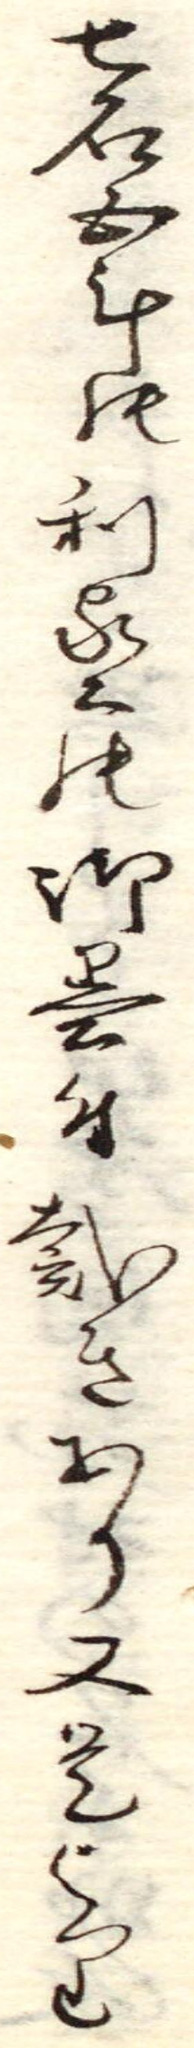七石五斗の利家公の御墨付戴きあり又是より
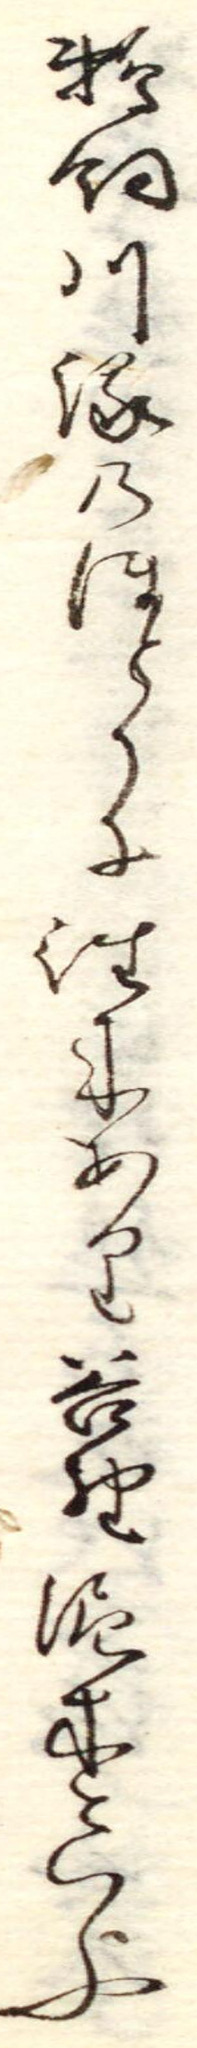鵜飼川縁のほとりに往来あり善野泥木といふ
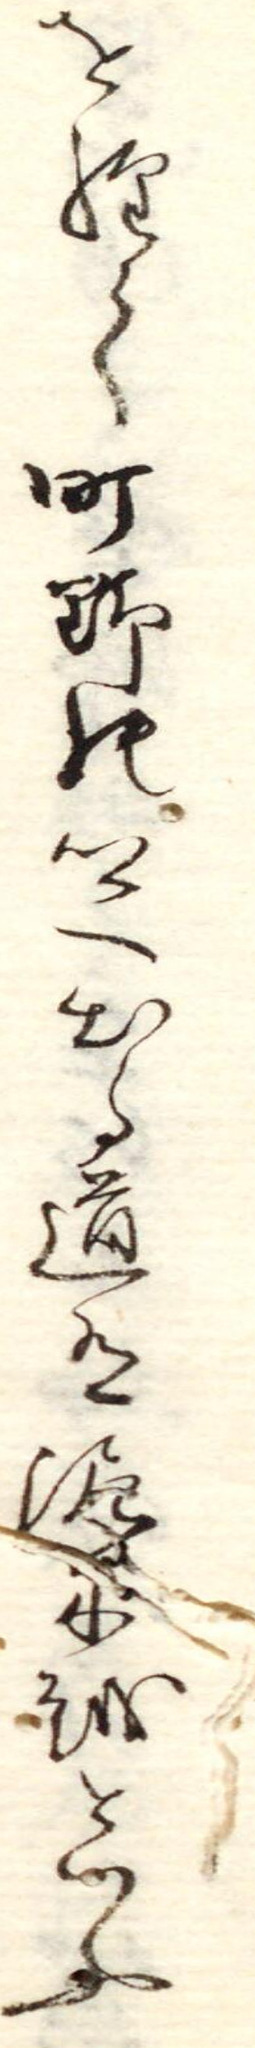を経て町野の郷へ出る道有泥木越といふ
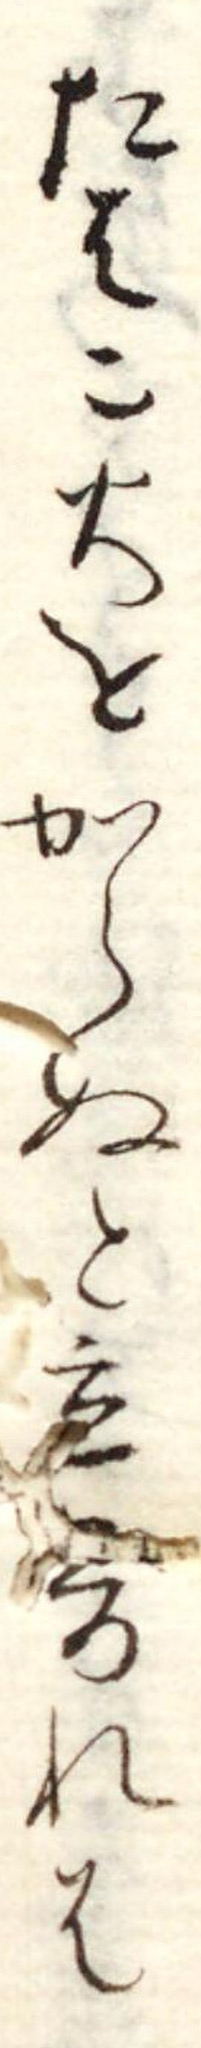たはこ火をからぬと立寄れは
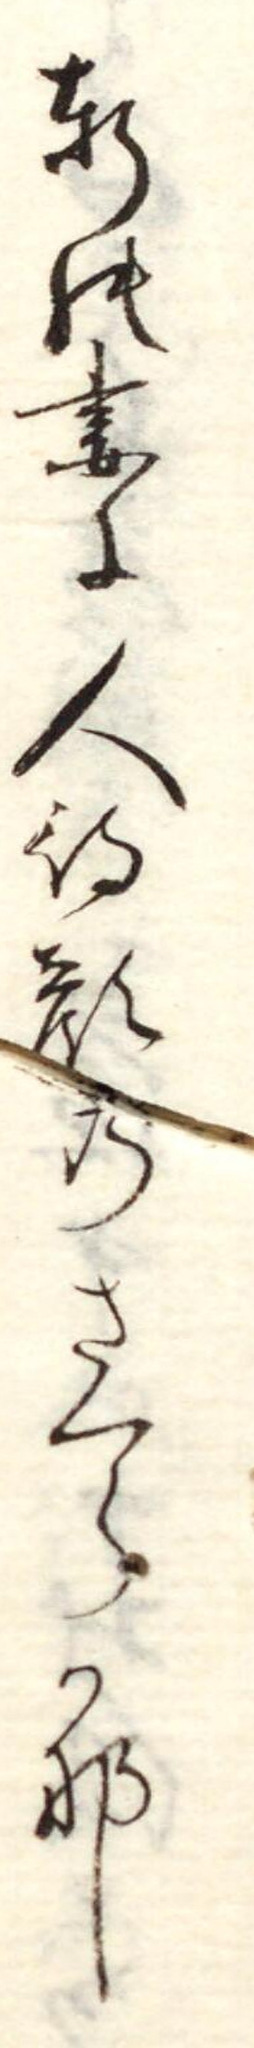軒の妻に人待顔のさくらかな
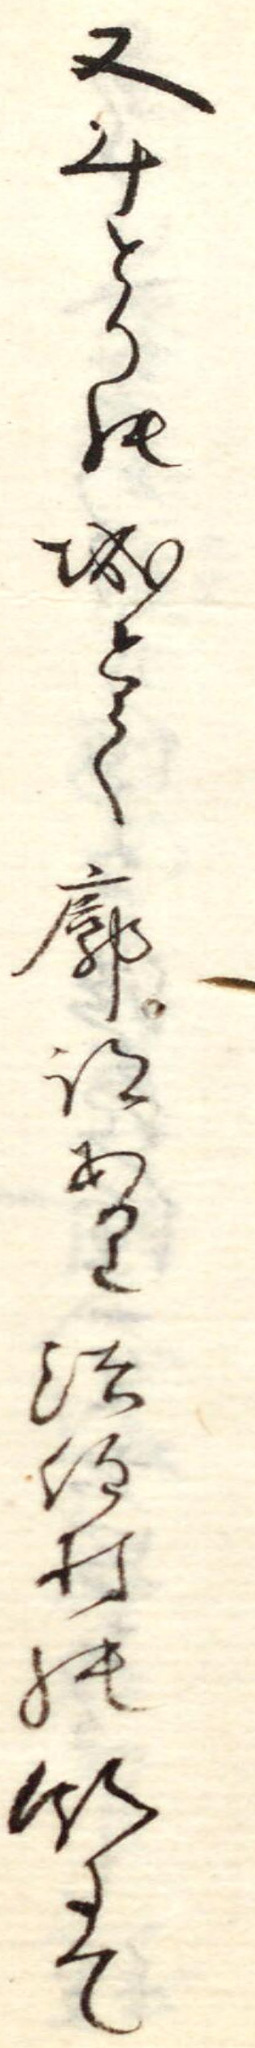又千とりの城とて廓跡あり法住寺の領にて
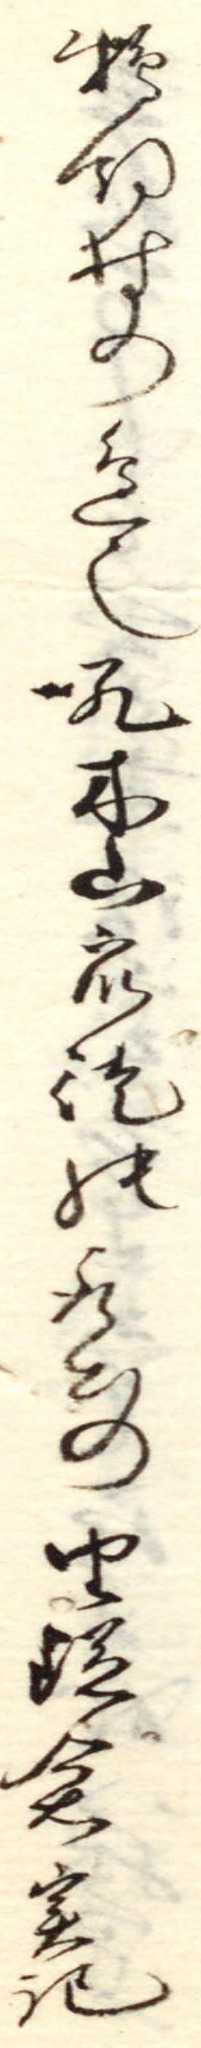鵜飼村の辺也吼木山衆徒の取出の由鎌倉実記
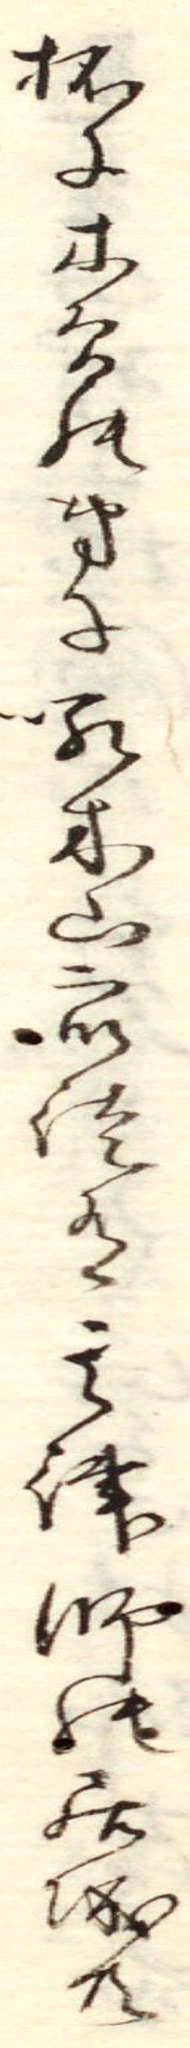抔に木曽の弟子吼木山衆徒有其律師の居城共
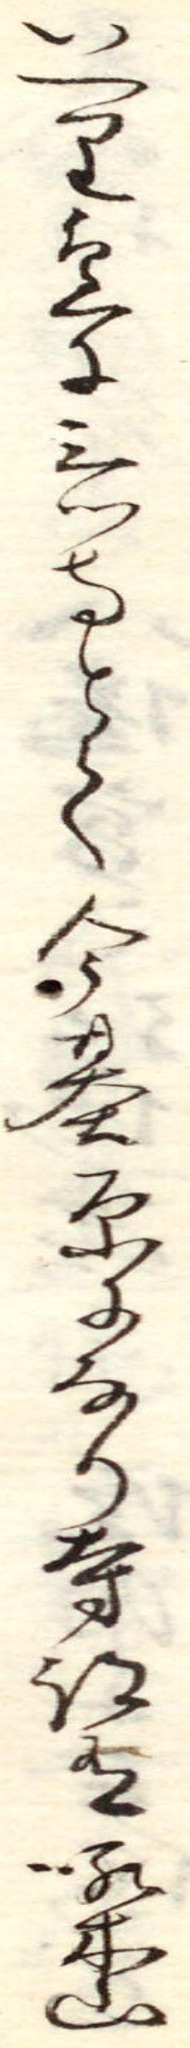いへり辺に三ッ寺とて今基原になり寺跡有吼木山
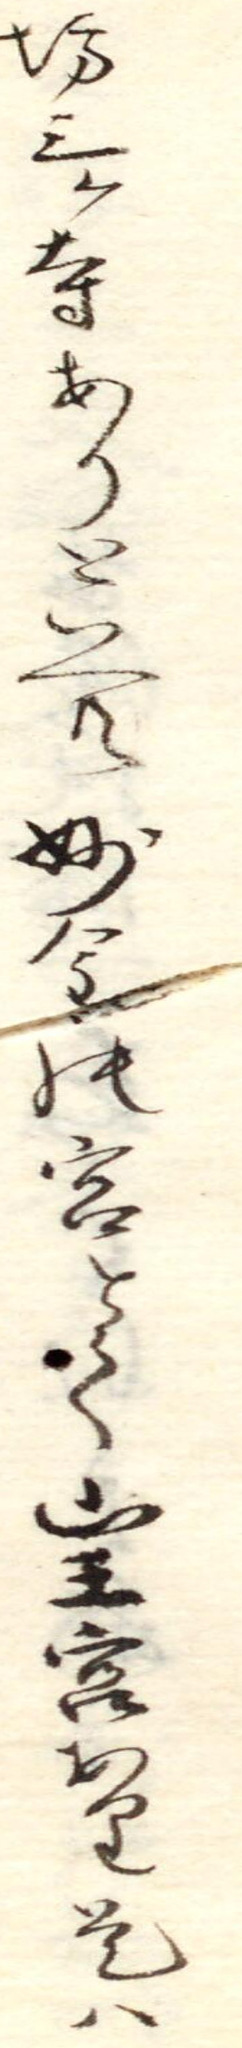坊三ヶ寺ありといへ共妙金の宮とて山王宮あり是は
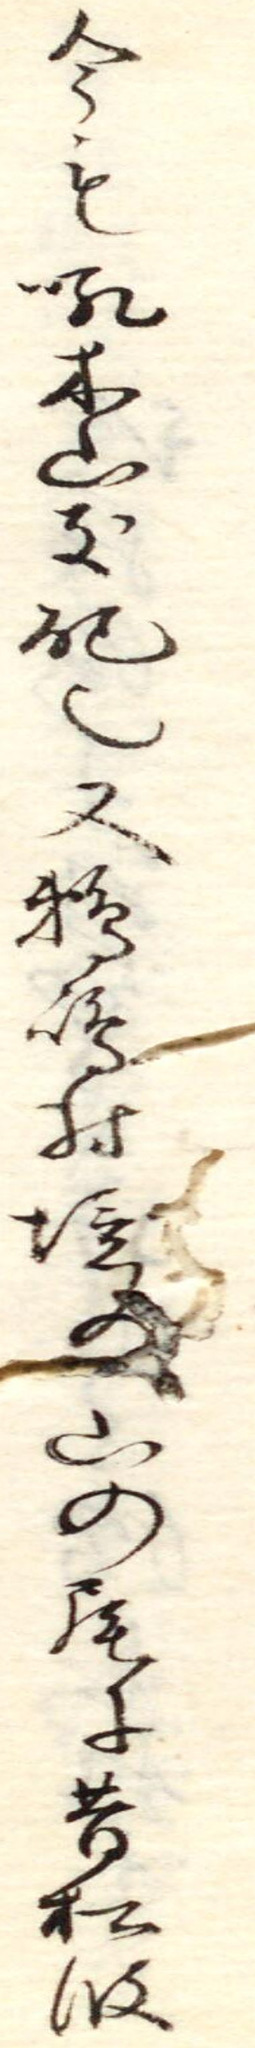今も吼木山支配也又鵜嶋村境の山の尾に昔松波
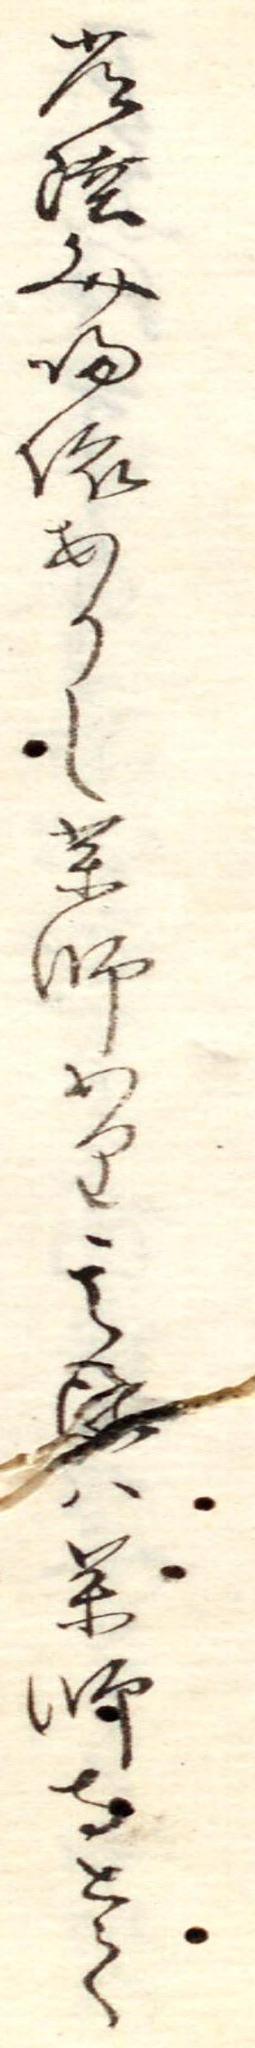常陸介帰依ありし薬師あり其頃は薬師寺とて
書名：能登名跡誌
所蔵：Ishikawa Prefectural Library
